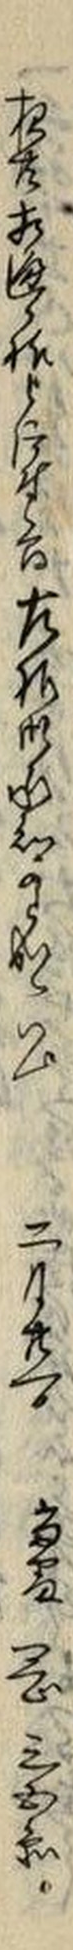夜共相通候様被仰付候間左様御承知可被成候以上二月廿一日当番岡三五兵衛
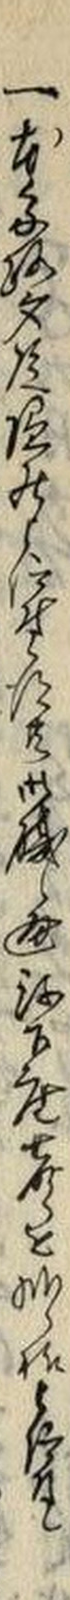一本多路夕殿隠居被仰付候得共御職之通致下座声を掛候様被仰付候
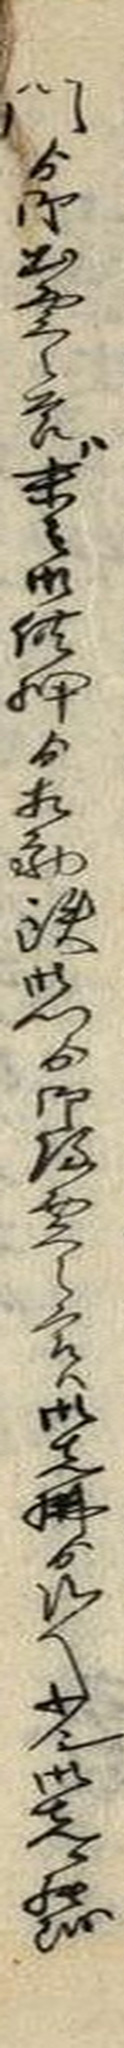門ゟ御出殿之節は末々御供押ゟ相勤鉄御門ゟ御帰殿の節は御先払ゟ弐人少し御先へ罷越
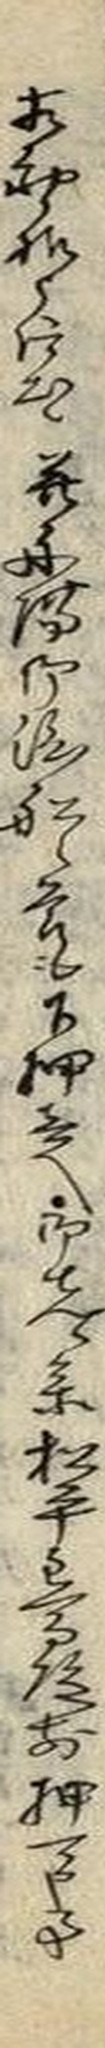相勤候様被仰出候并舟場御渡船之節も下押壱人御先へ参松平主馬殿前押可申事
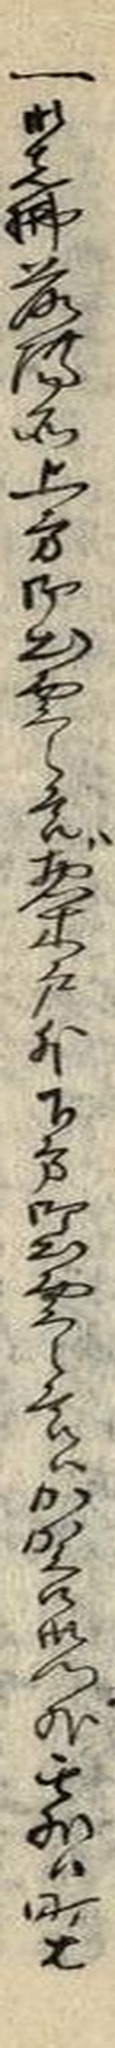一御先払落場所上方御出殿之節は惣木戸外下方御出殿之節は加賀御門外其外は町
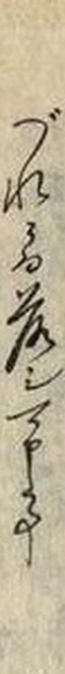はづれに而落し可申事
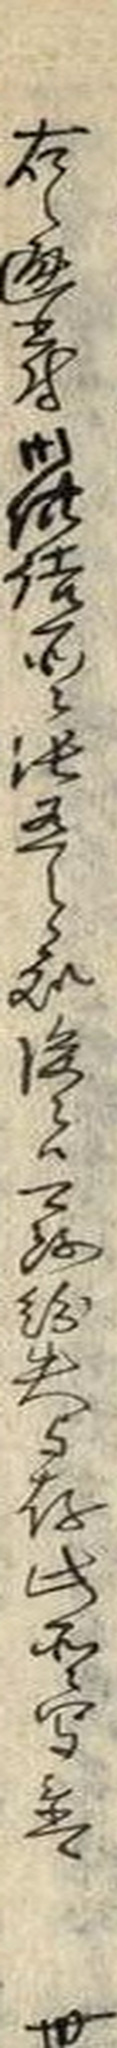右之通書付御供詰所に張有之候処後には可致紛失と存此所に写置候世話番
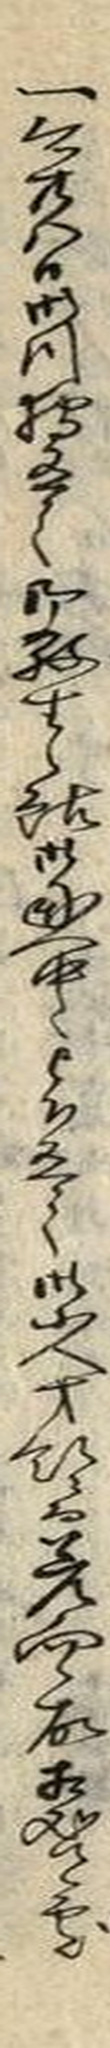一今廿八日御川狩有之御殺生之鮎御用人中へ被下有之御小人才領に而差向候故相咎候処
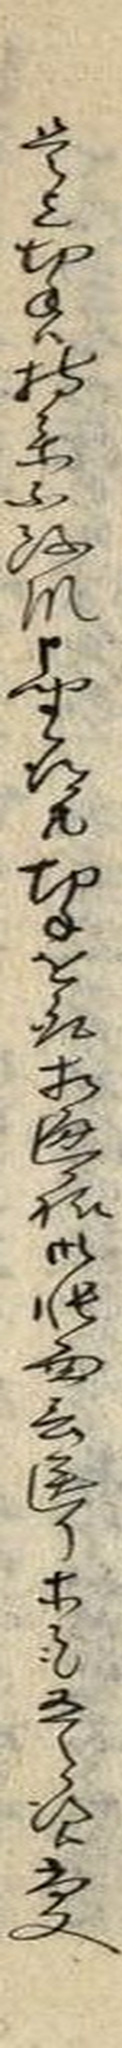是迄切手は持参不致段申聞候得共切手を取相通候様御帳面言送り等にも有之候得は尚又
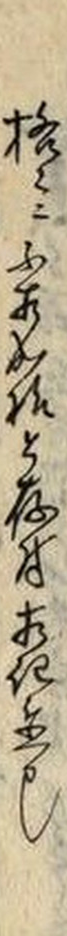格々に不相成様と存付相記置申候
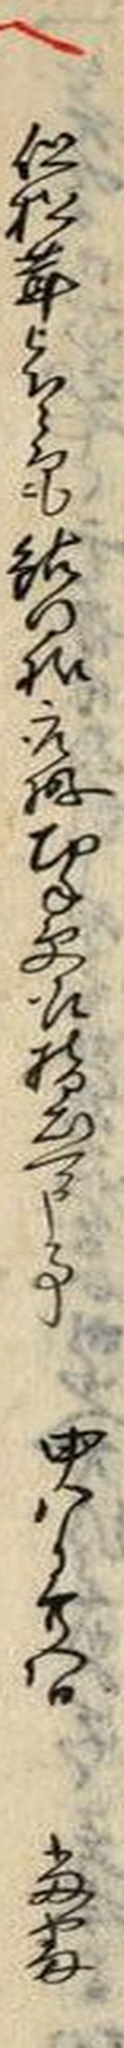但松茸被下候而も鮎同様取扱切手受取指出可申候事申八月廿八日当番

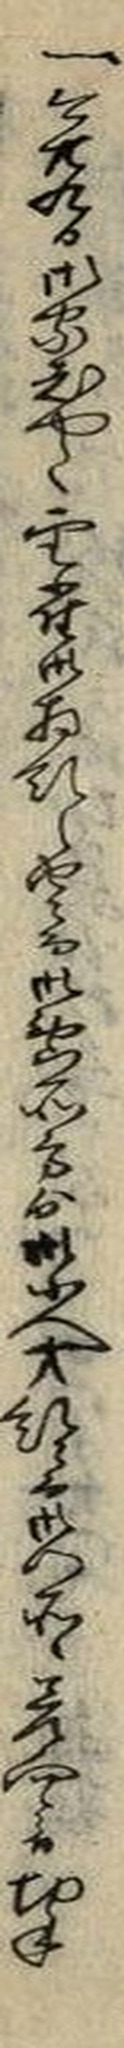一今廿九日御家老中へ雲雀御拝領之由に而御台所ゟ御小人才領ニ而御門所へ差向候に付切手
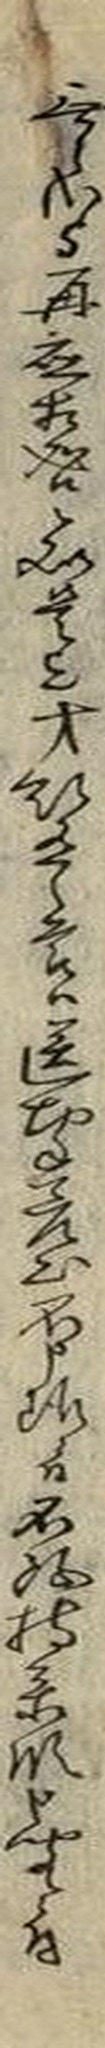無之哉と再応相咎候処是迄才領有之節は送切手差出不申趣に付不致持参候段申聞候に付
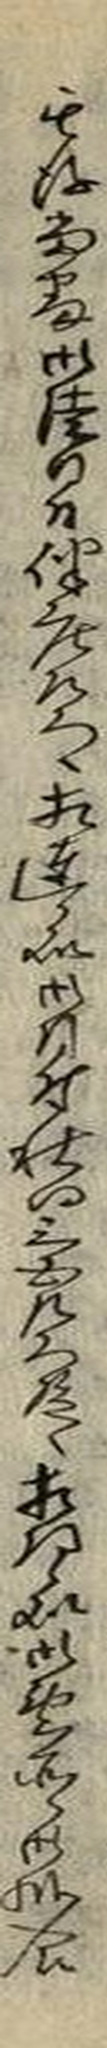其後当番御徒目付伴庄左衛門へ相達候処御目付秋田三五左衛門殿へ相伺候処御台所へ御掛合
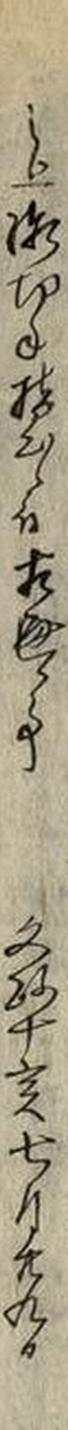之上漸切手指出候に付相通候事文政十亥七月廿九日当番
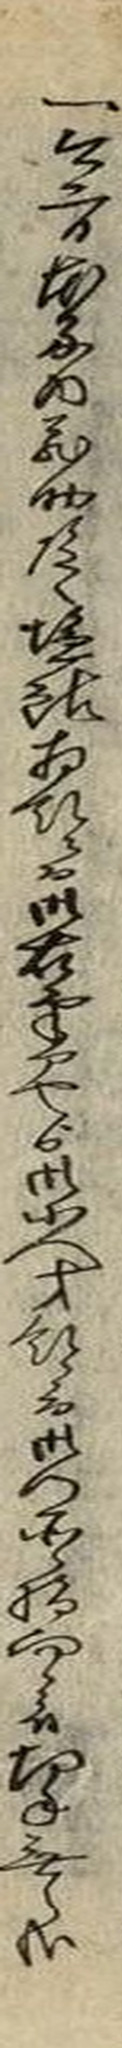一今二日本多内蔵助殿へ塩鮎拝領に而御右筆部やゟ御小人才領に而御門所指向候に付切手無之哉
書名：御門御櫓之部
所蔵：福井県文書館 Fukui Prefectural Archives
